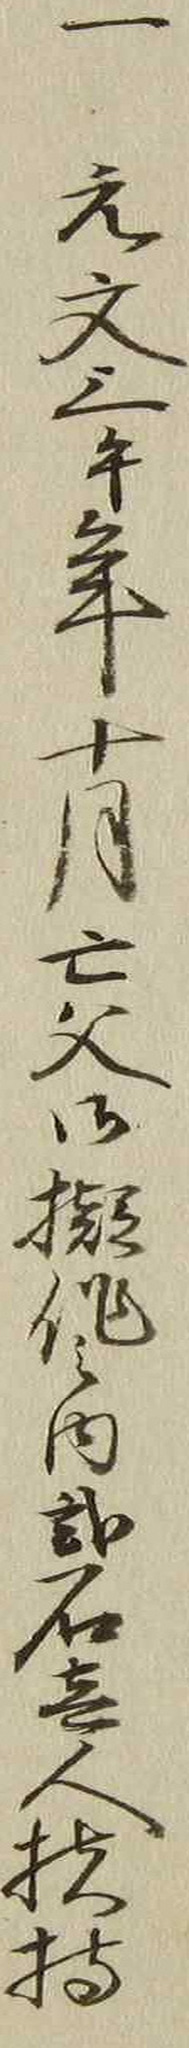一元文三午年十月亡父御擬作之内弐石壱人扶持
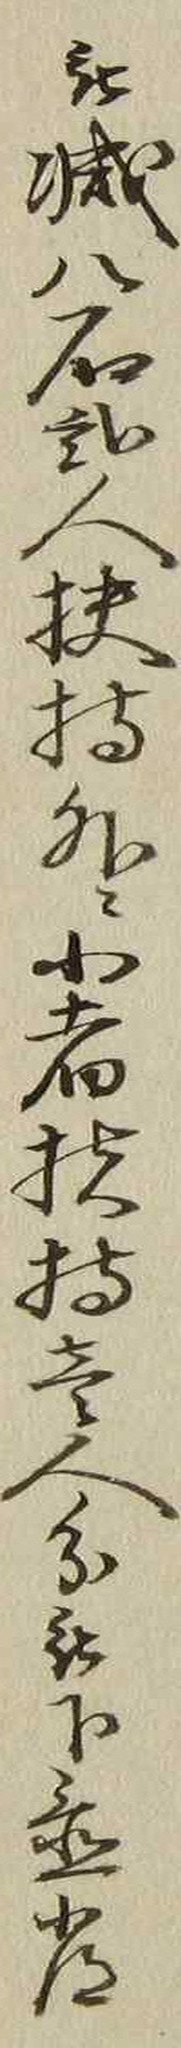被減八石弐人扶持外ニ小者扶持壱人分被下置常
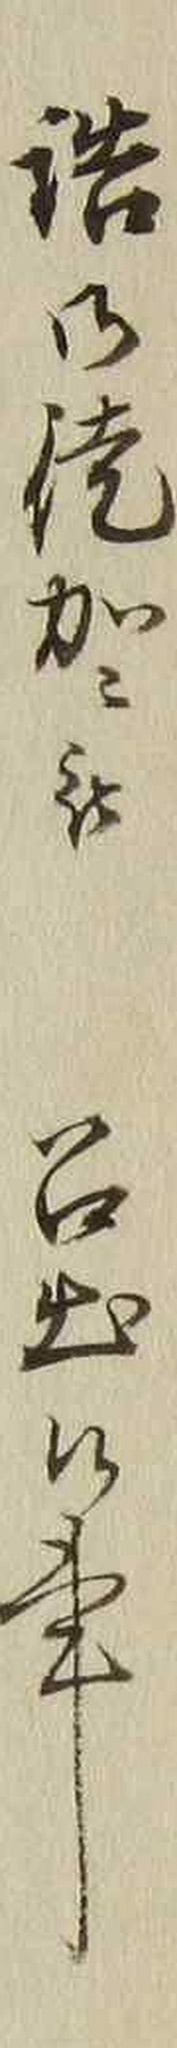詰御徒加ニ被召出候事
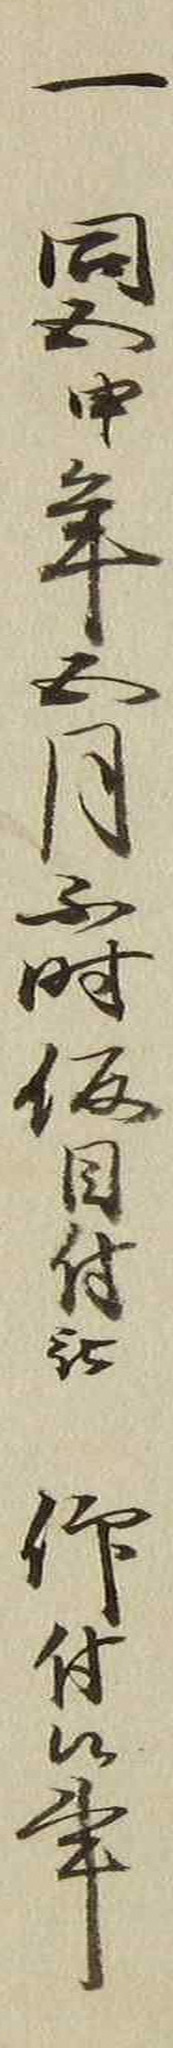一同五申年五月ふ時仮目付被仰付候事
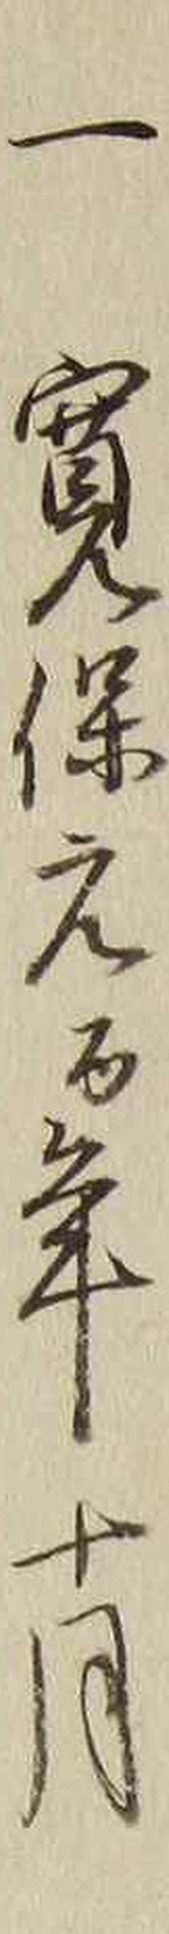一寛保元酉年十月
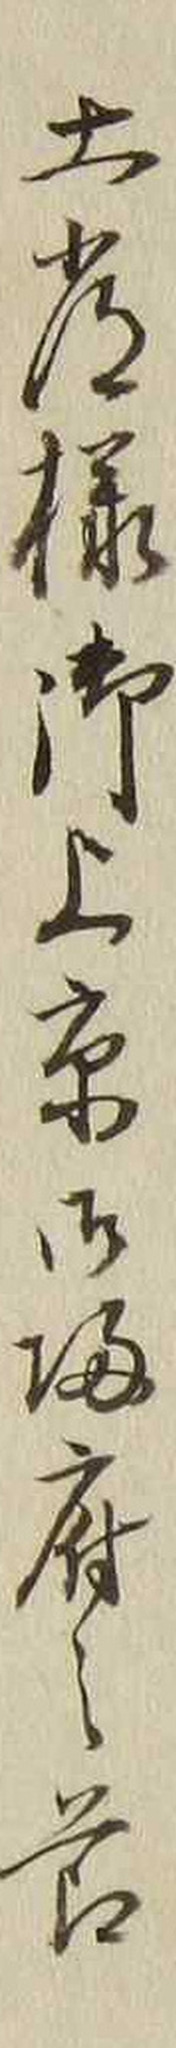土常様御上京御帰府之節
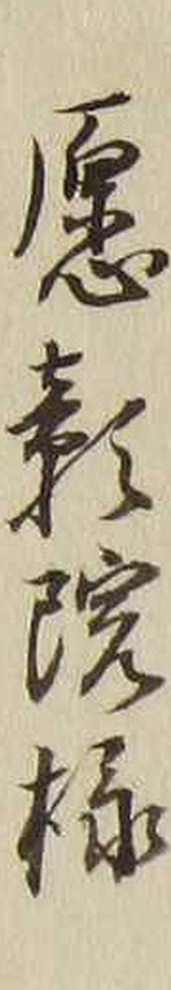愿影院様
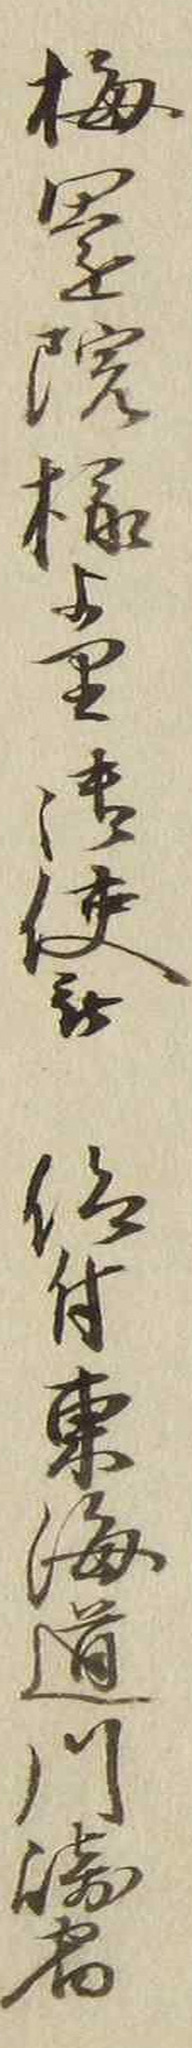梅園院様より御使被仰付東海道川崎宿

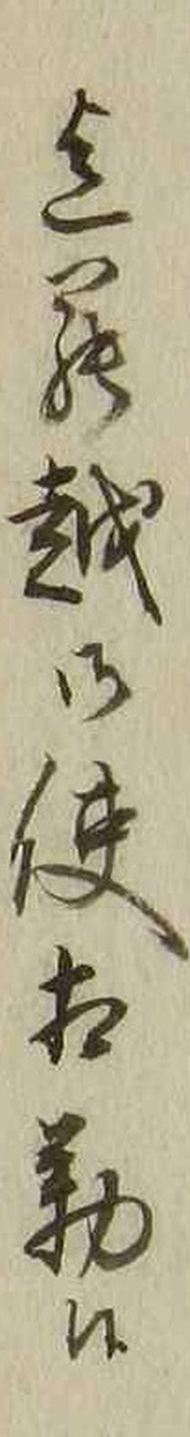迄罷越御使相勤候
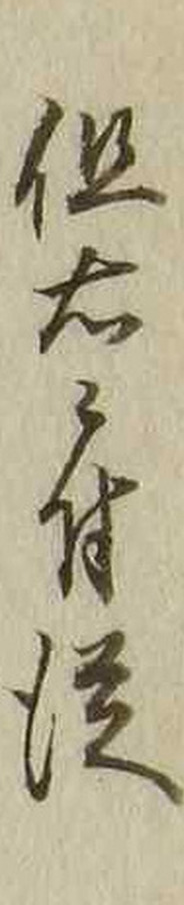但右ニ付従
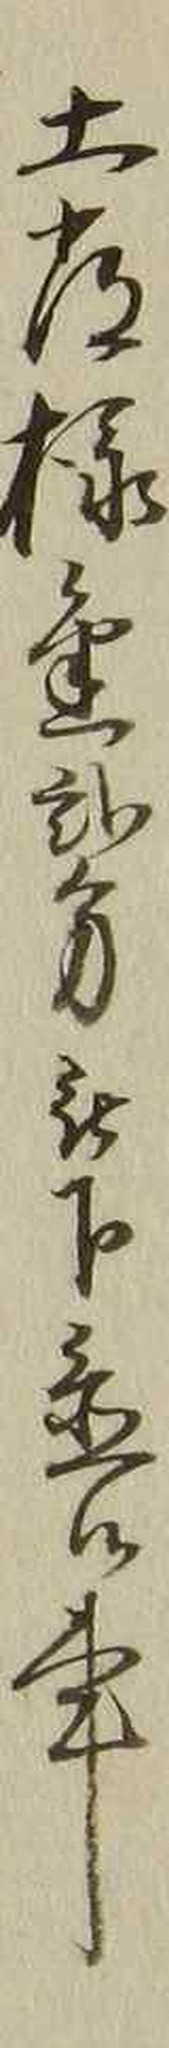土常様金弐方被下置候事
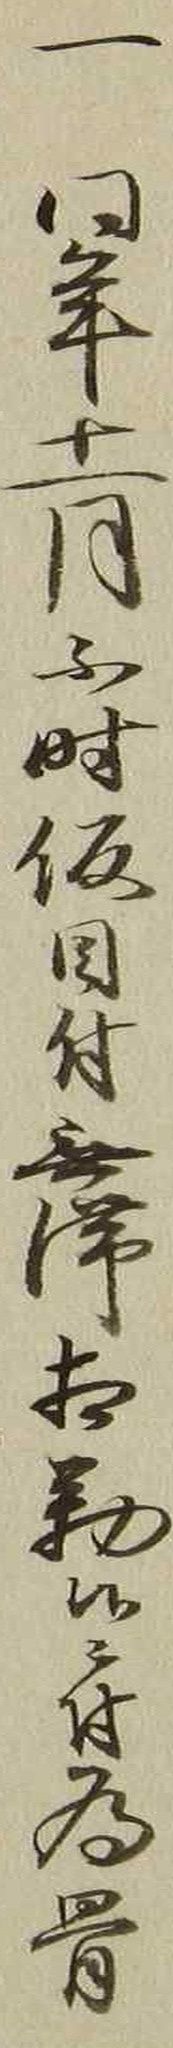一同年十一月ふ時仮目付無滞相勤候ニ付為骨
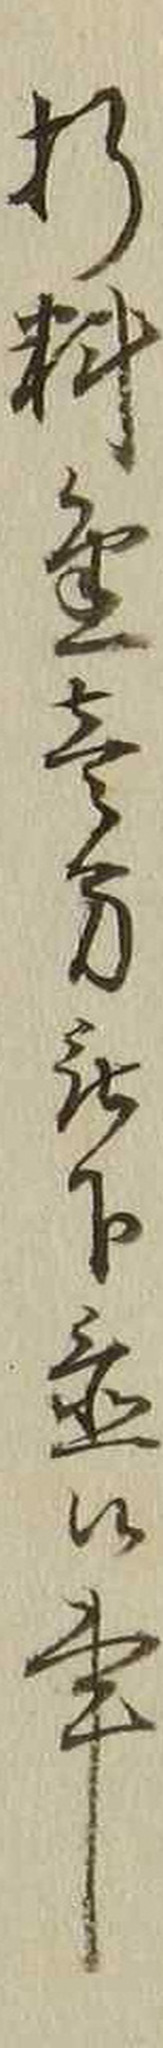折料金壱方被下置候事
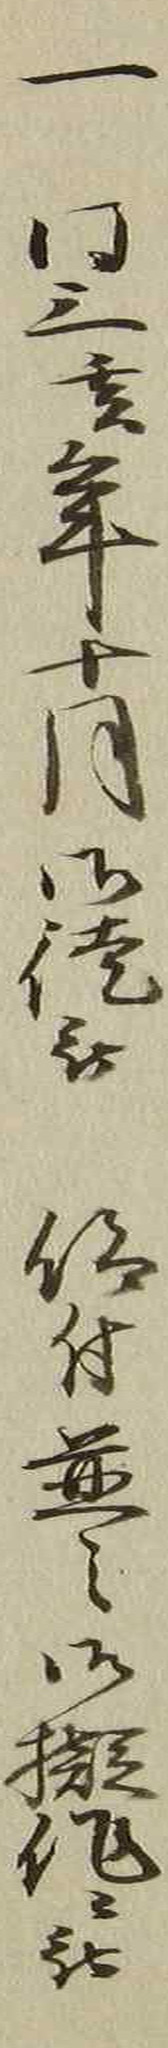一同三亥年十月御徒被仰付並之御擬作二被
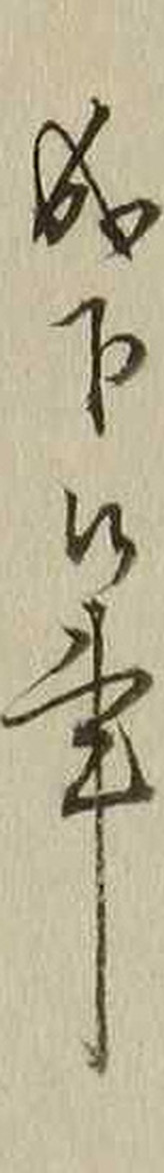成下候事
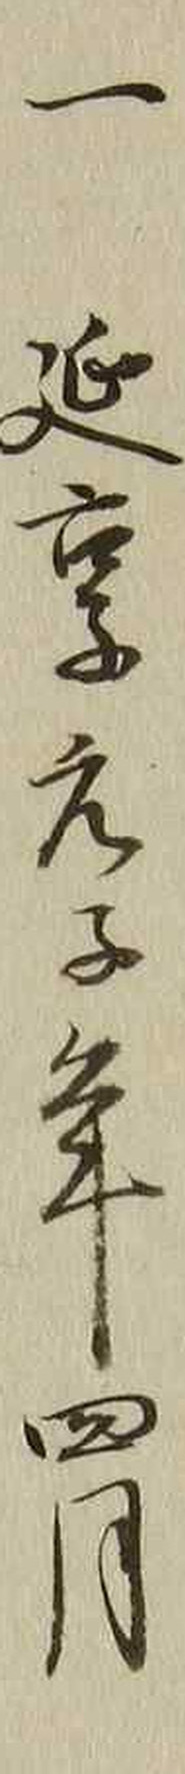一延享元子年四月
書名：諸士系譜　巻之114　か之部22
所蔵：会津若松市立会津図書館
